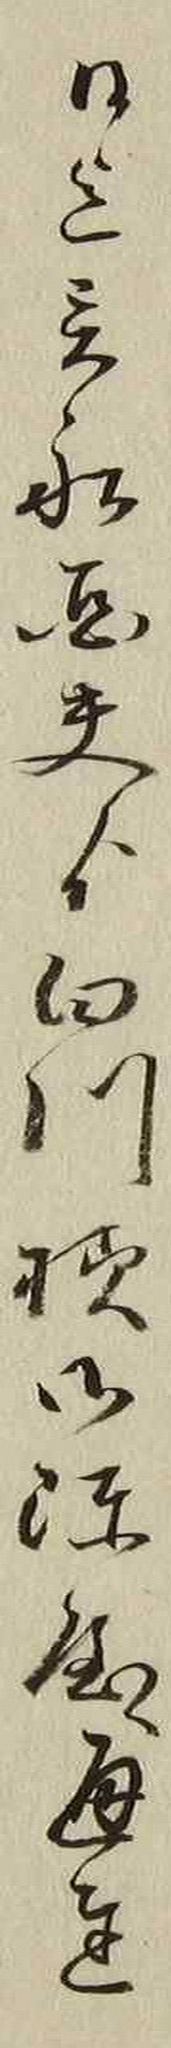日迄異船固夫ゟ白川様御陣屋へ通達
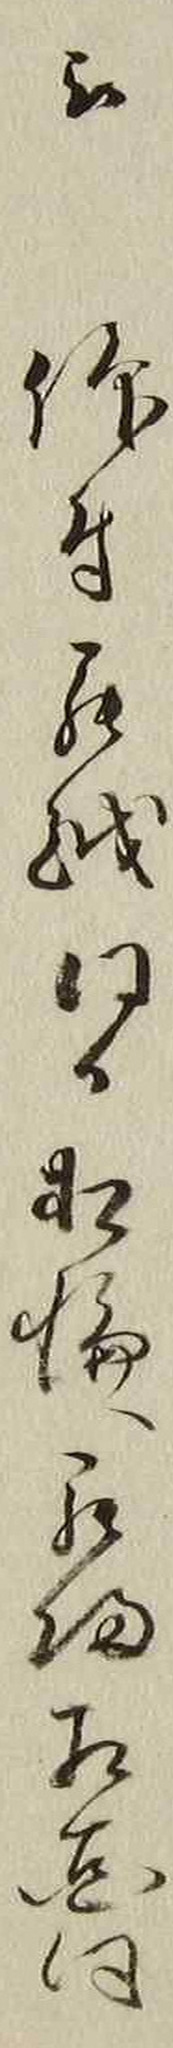被仰付罷越同日松輪へ罷帰相固同
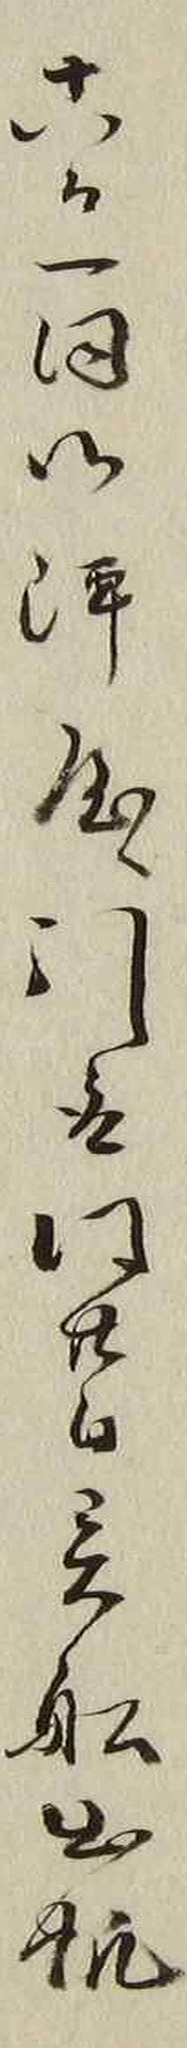十八日一同御陣屋へ引取同廿日異船出帆
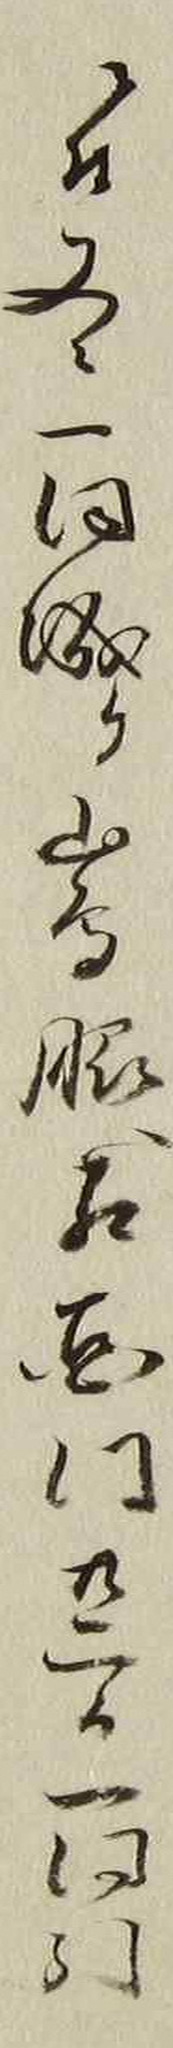ニ付又々一同城ケ嶋脇へ相固同廿二日一同引
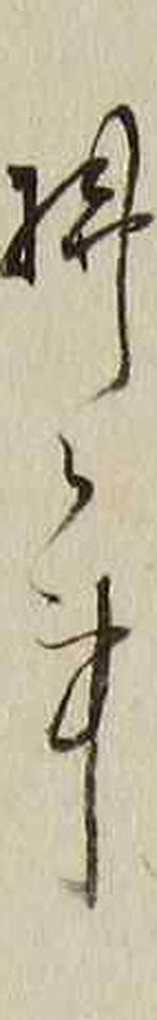払候事
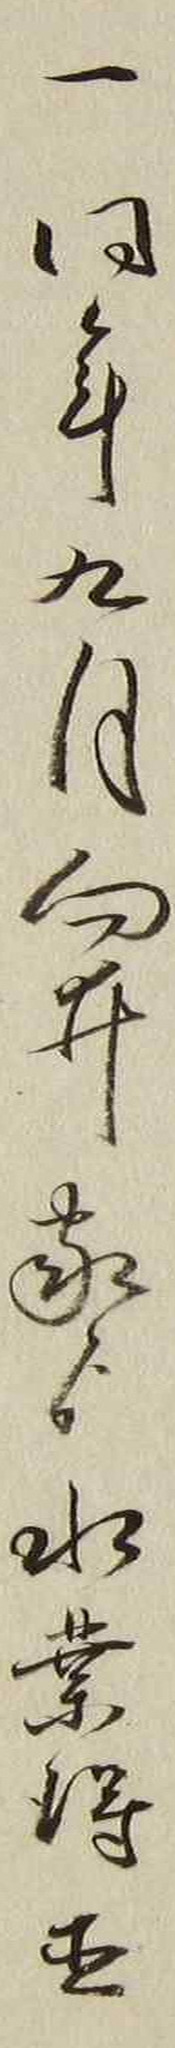一同年九月向井家ゟ水業得直
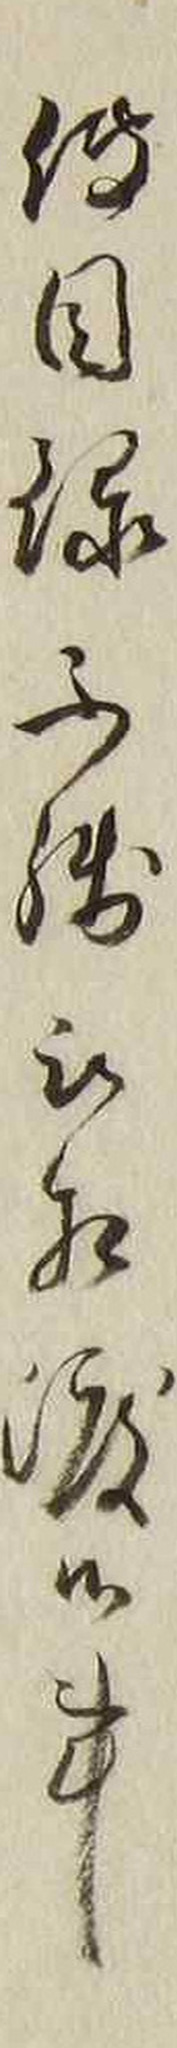伝目録不残被相渡候事
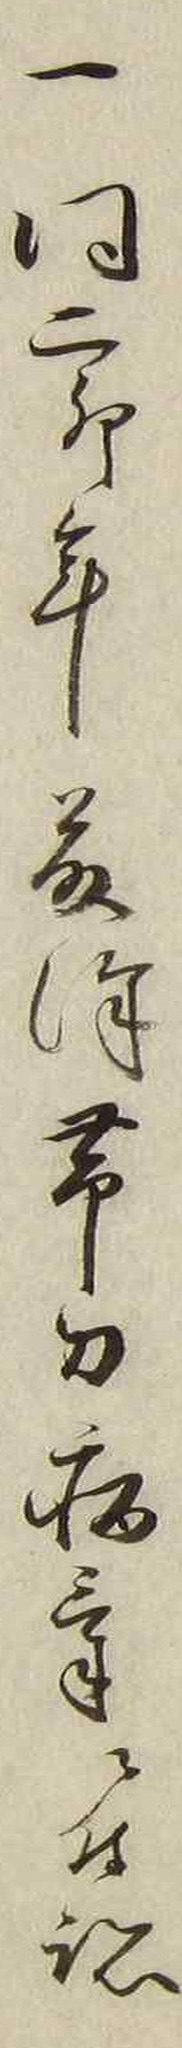一同二卯年藤沢帯刀病気ニ付跡

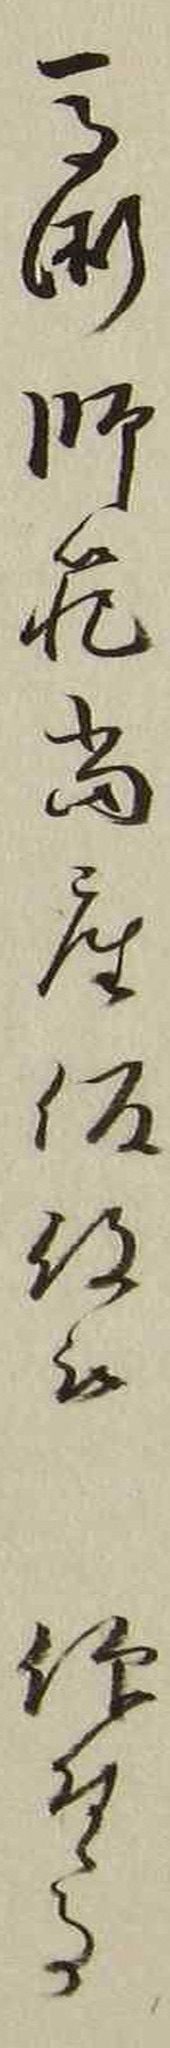馬術師範当座仮役被仰付候事
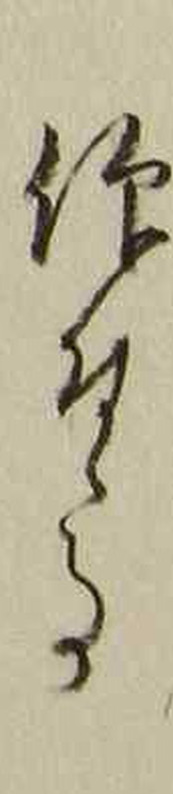仰付候事
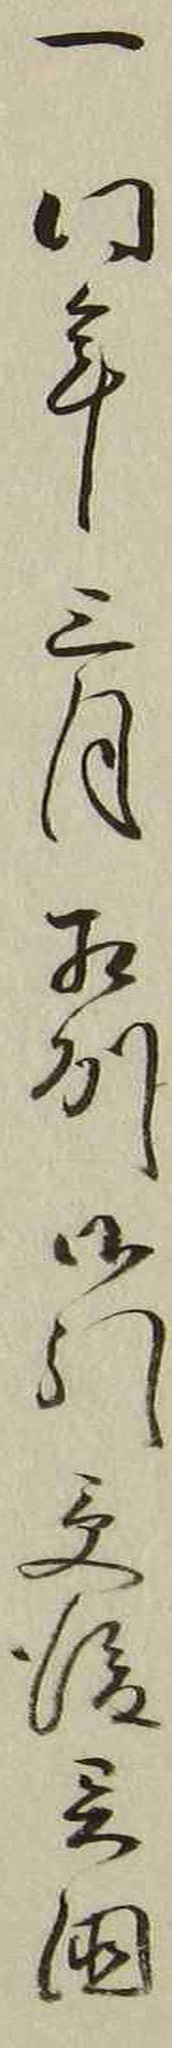一同年三月相州御引受後異国
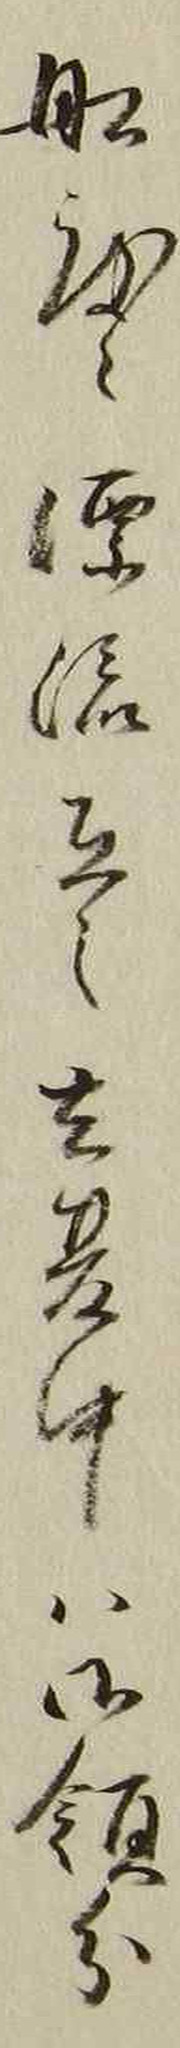船度々漂流在之去夏中ハ御領分
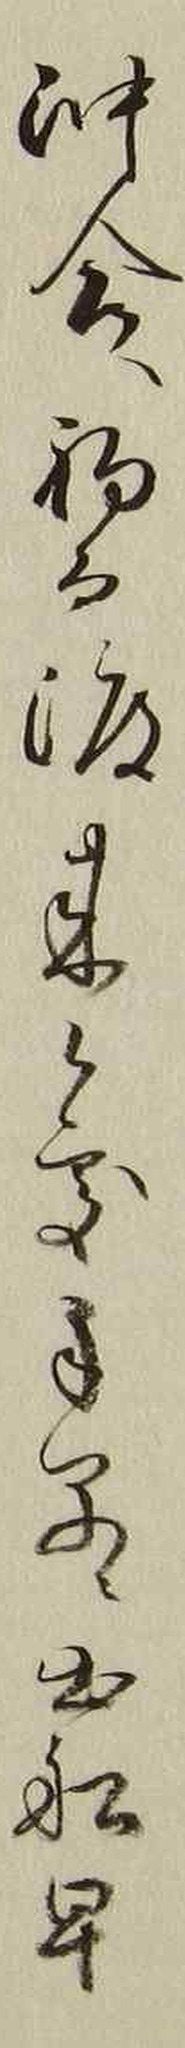沖合へ初而渡来候処手早ニ出船早
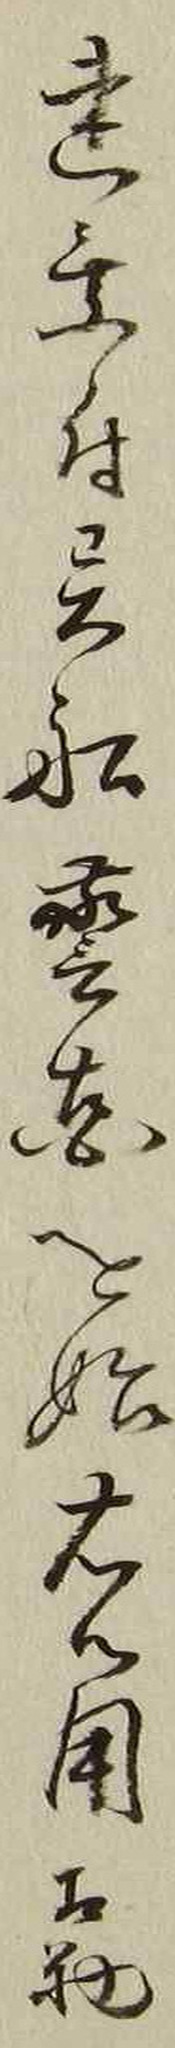速乗付異船警固を始右御用相勤
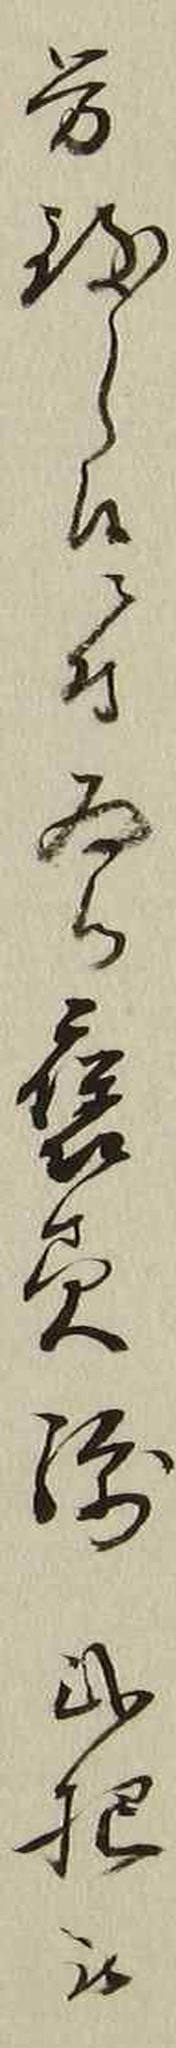労致し候ニ付為御褒美綿弐把被
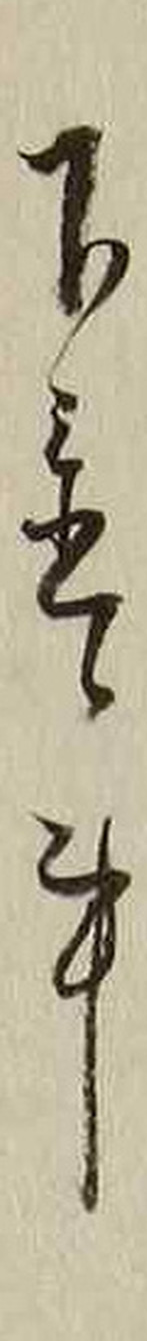下置候事
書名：諸士系譜　巻之28　い之部28
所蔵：会津若松市立会津図書館
